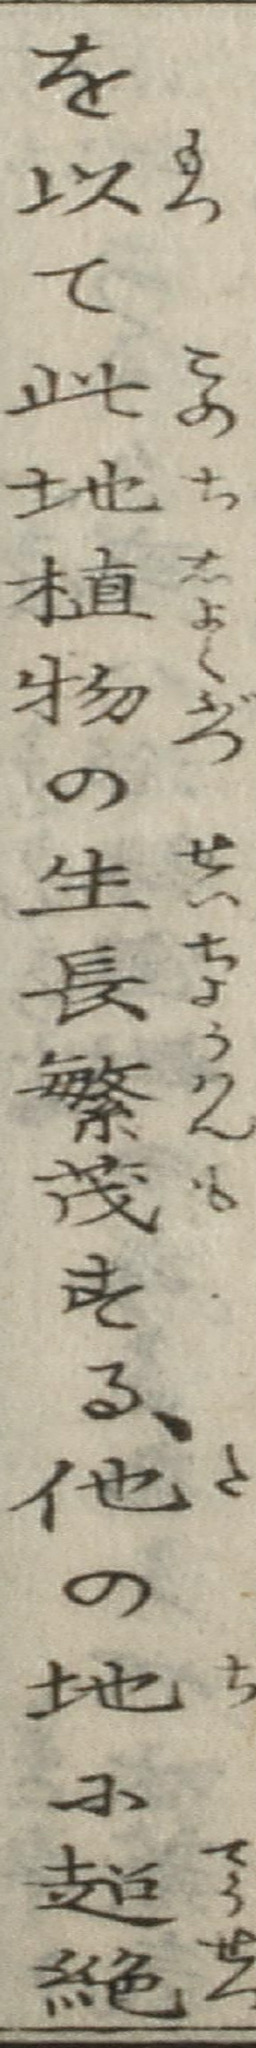を以て此地植物の生長繁茂する、他の地に超絶

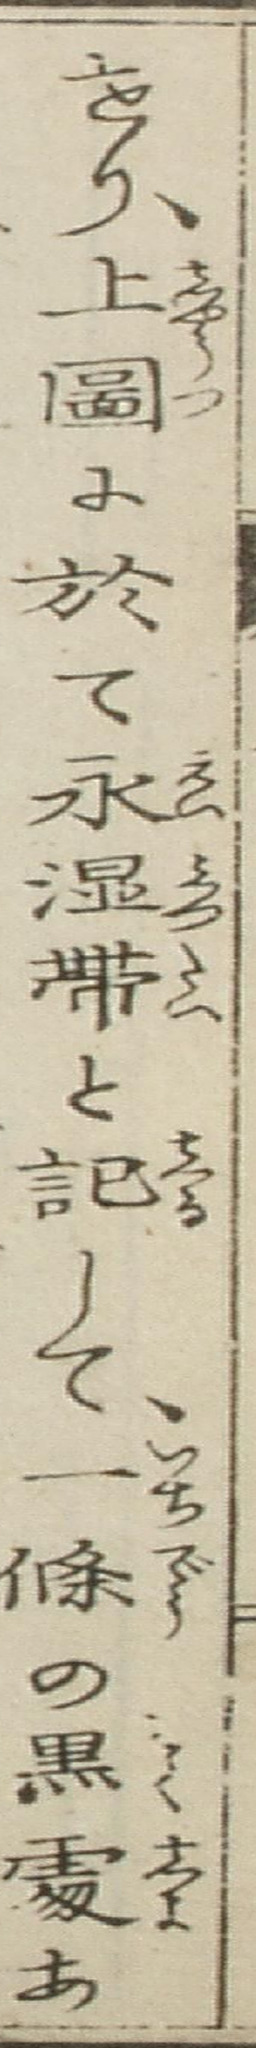せり、上図に於て永湿帯と記して、一条の黒処あ
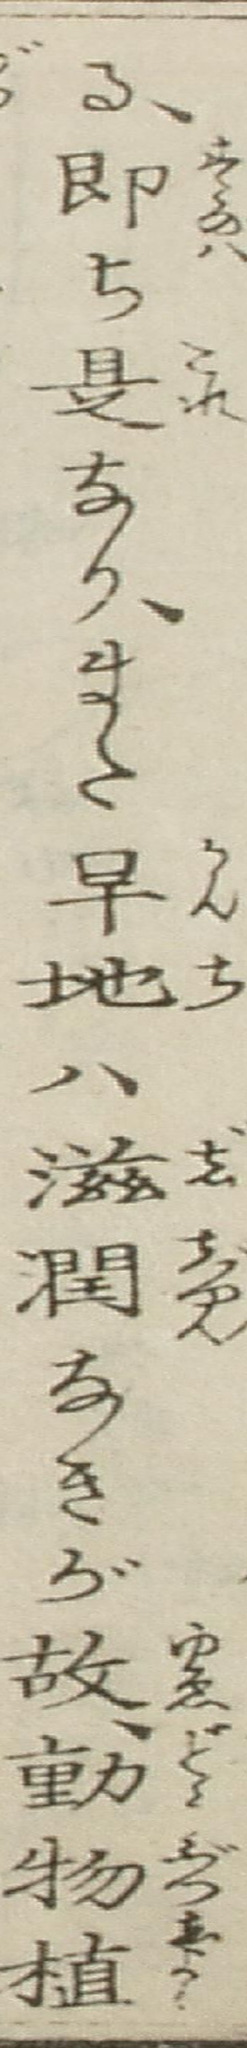る、即ち是なり、また旱地は滋潤なきが故、動物植
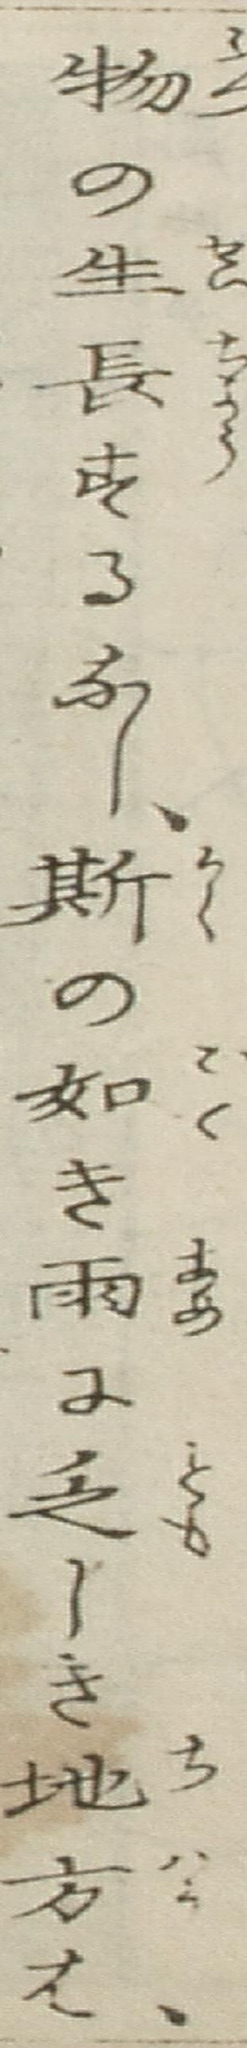物の生長するなし、斯の如き雨に乏しき地方は、
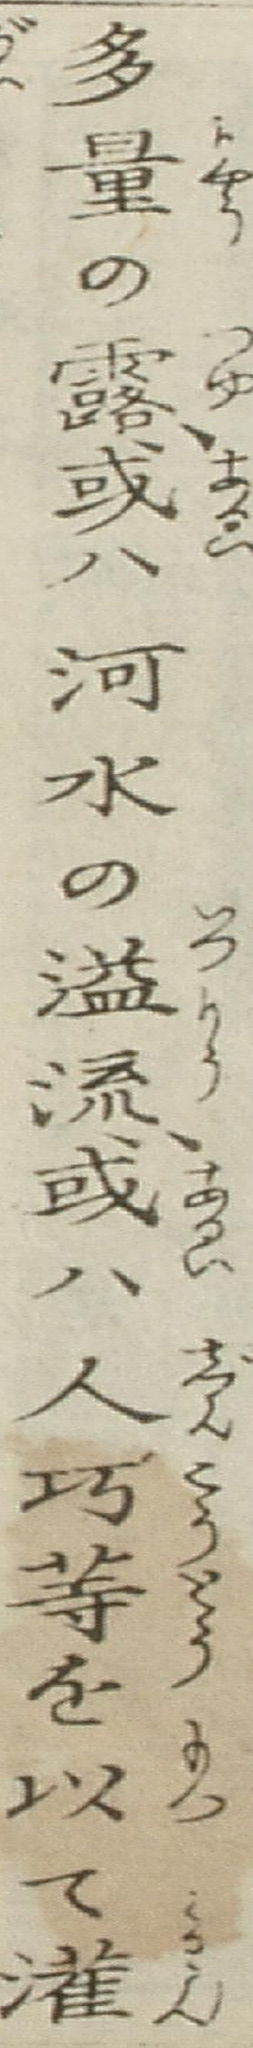多量の露、或は河水の溢流、或は人巧等を以て灌
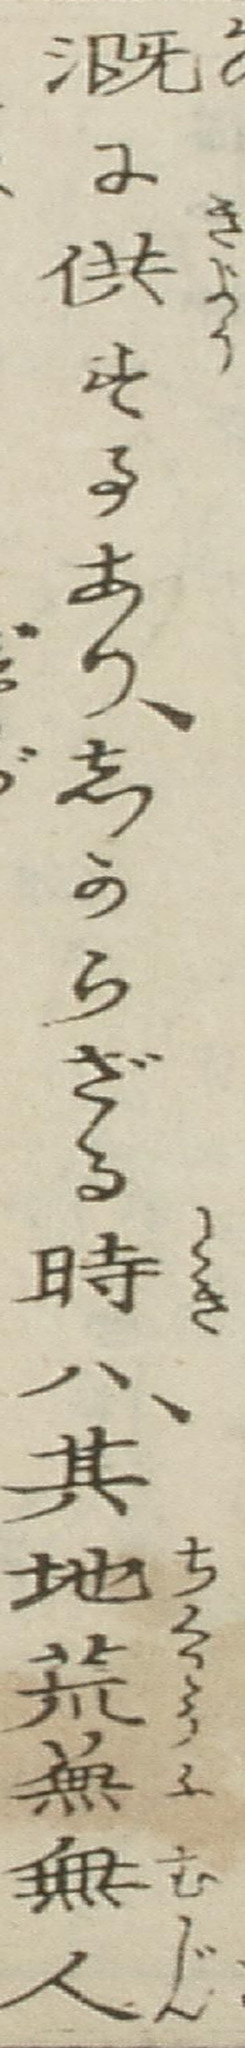漑に供するあり、しからざる時は、其地荒蕪無人
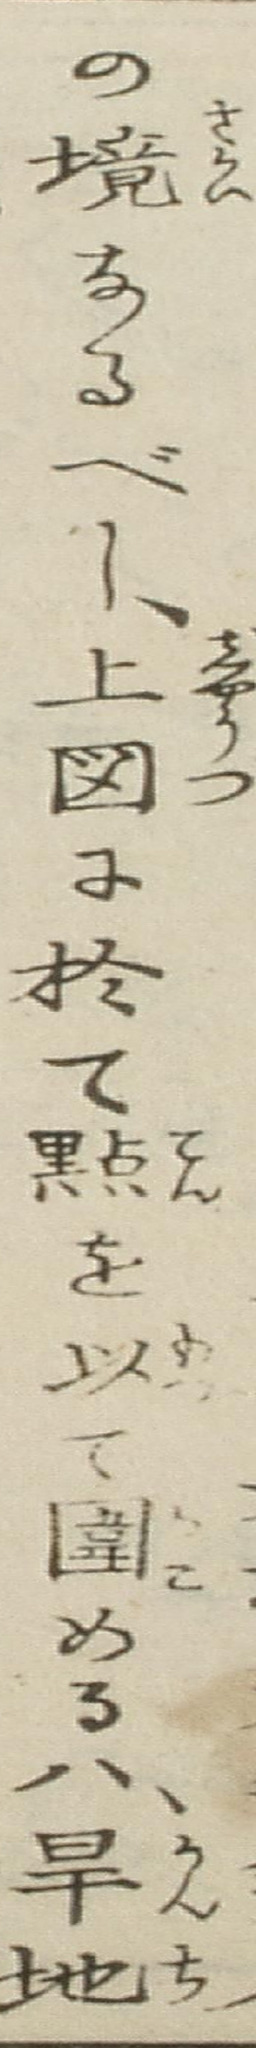の境あるべし、上図に於て点を以て囲めるは、旱地
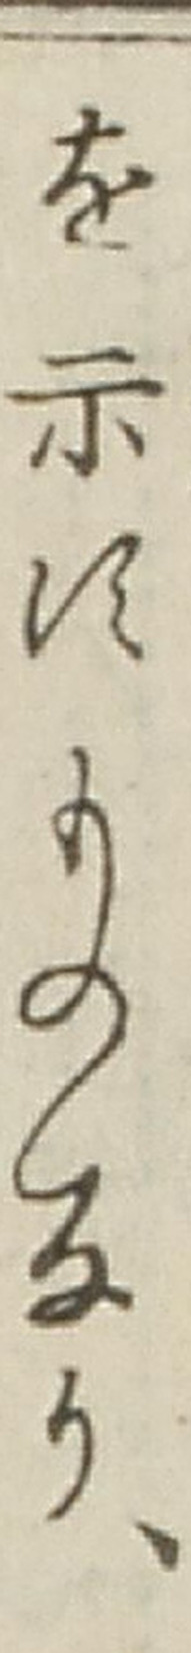を示すものなり、
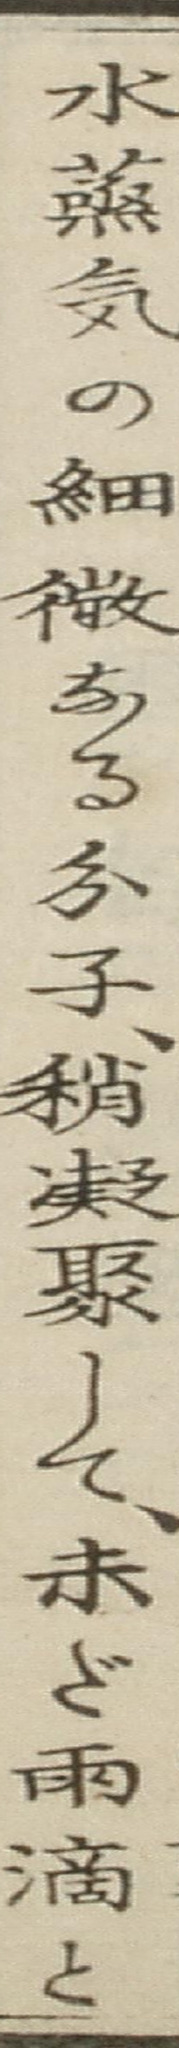水蒸気の細微なる分子、稍凝聚して、未だ雨滴と
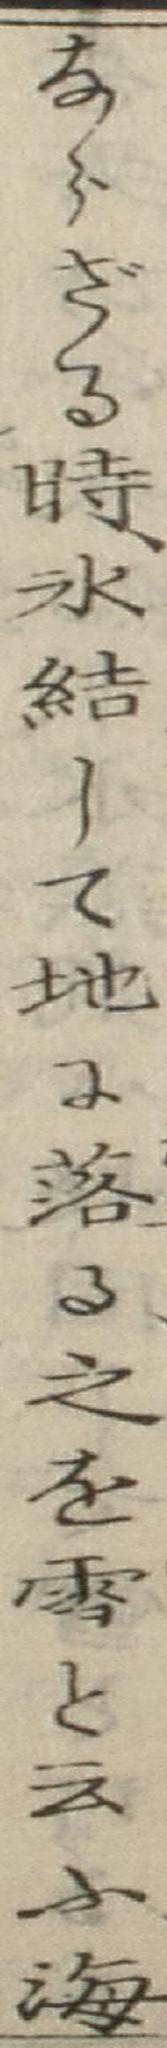ならざる時、氷結して地に落る、之を雪と云ふ、海
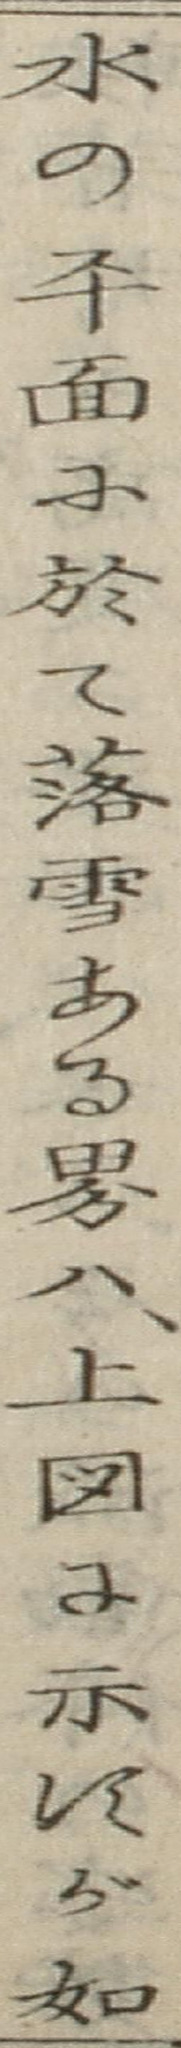水の平面に於て落雪ある界は、上図に示すが如
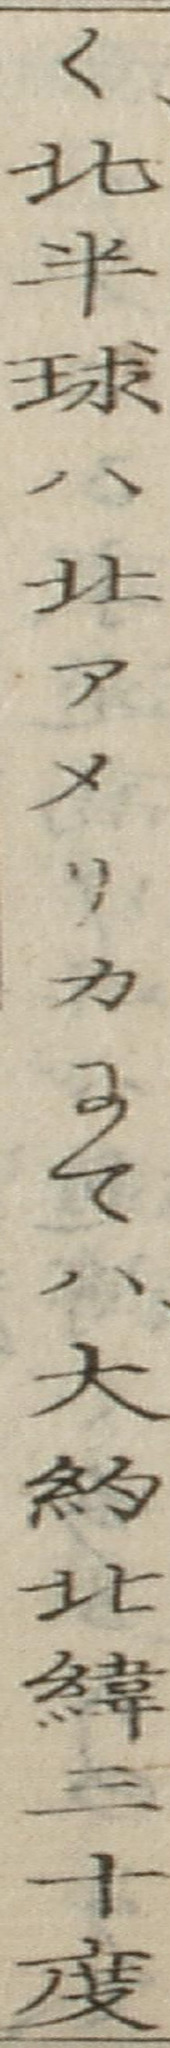く、北半球は北アメリカにては、大約北緯三十度
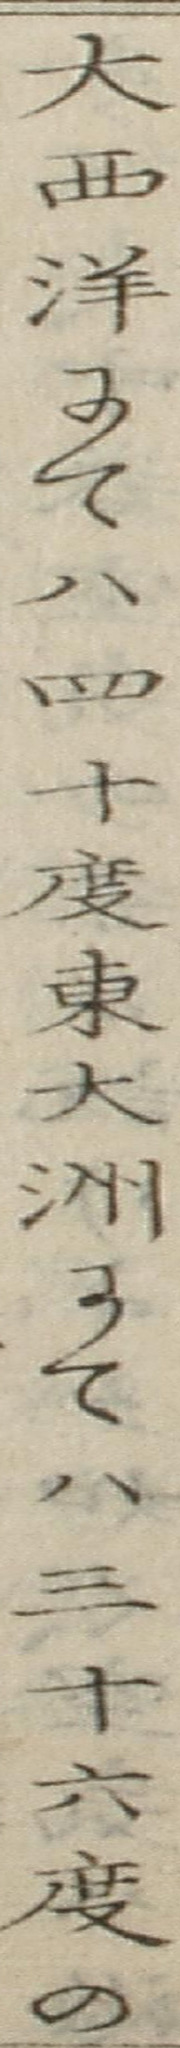大西洋にては四十度、東大洲にては三十六度の
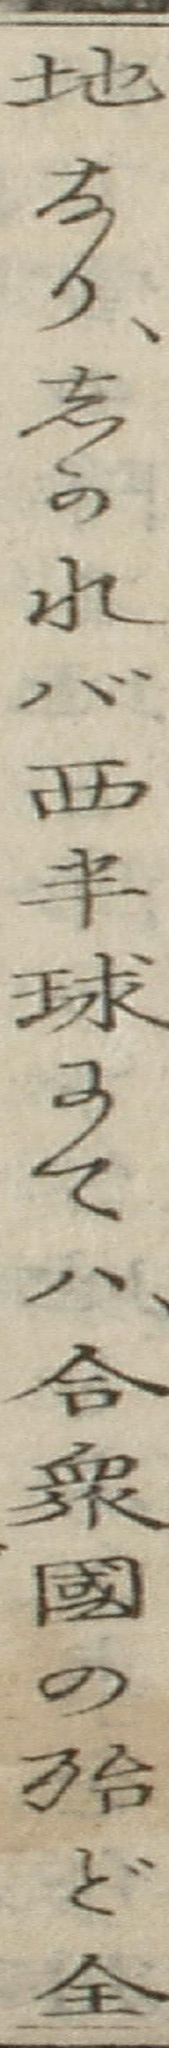地なり、しかれば西半球にては、合衆国の殆ど全
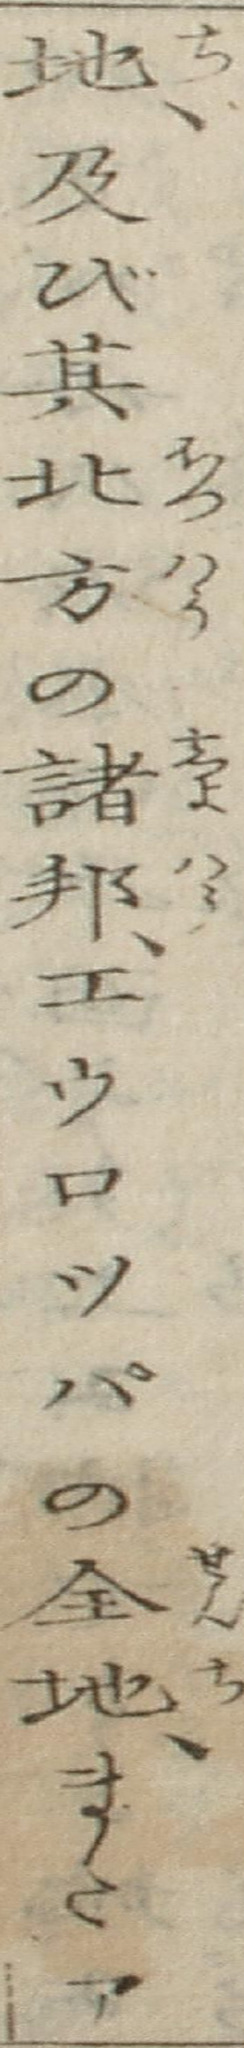地、及び其北方の諸邦、エウロツパの全地、またア
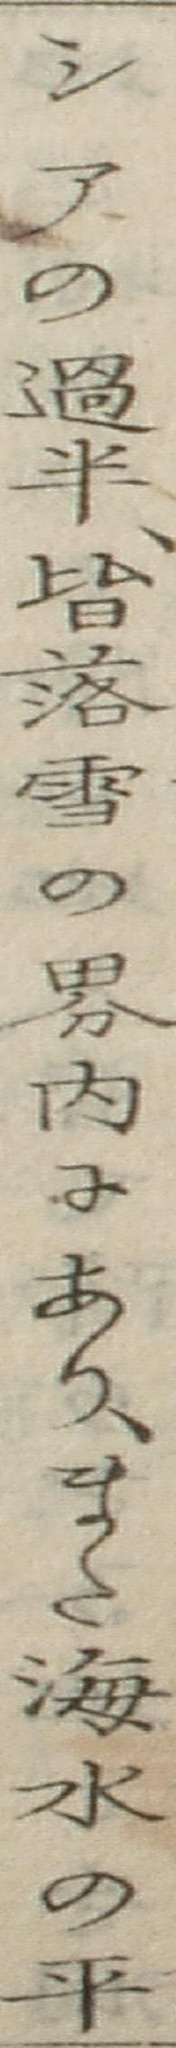シアの過半、皆落雪の界内にあり、また海水の平
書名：訓蒙　天然地理學　下
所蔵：東京大学地震研究所図書室 Earthquake Research Institute Library, The University of Tokyo, JAPAN
